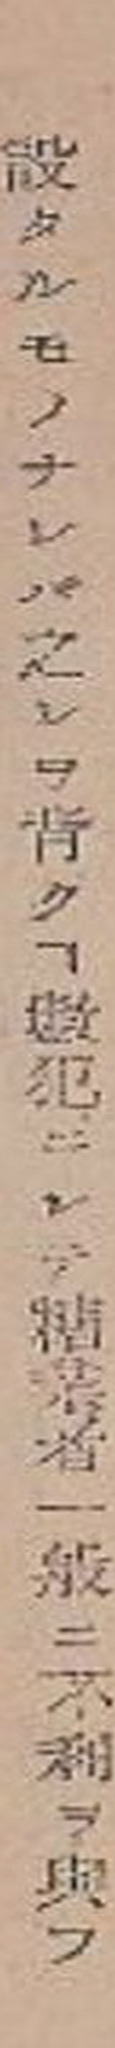設タルモノナレバ之レヲ背クヿ數犯ニシテ糖業者一般ニ不利ヲ與フ
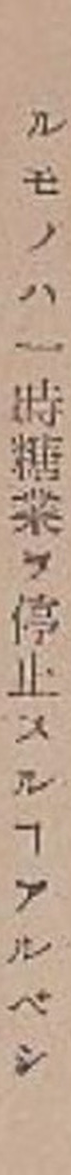ルモノハ一時糖業ヲ停止スルヿアルベシ
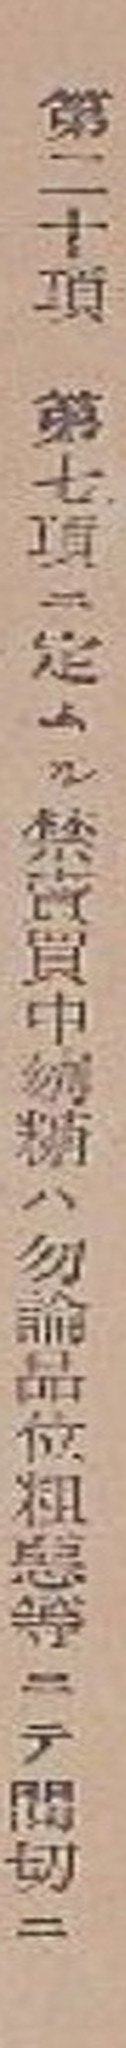第二十項第七項ニ定ムル禁賣買中納糖ハ勿論品位粗悪等ニテ間切ニ
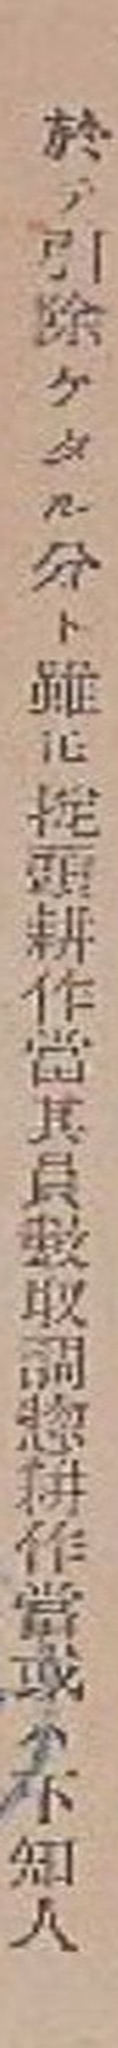於テ引除ケタル分ト雖トモ掟頭耕作當其員數取調惣耕作當或ハ下知人
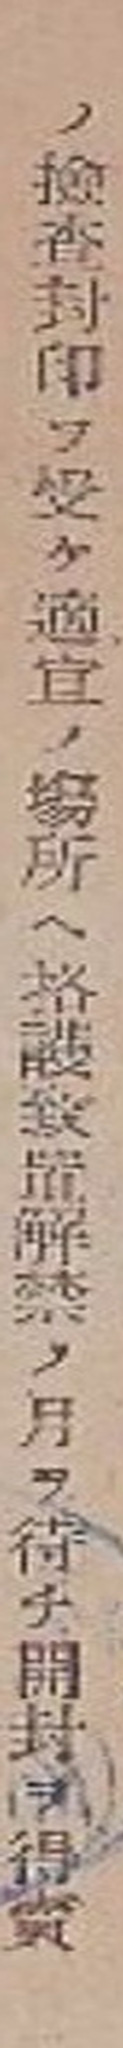ノ撿査封印ヲ受ケ適宜ノ場所ヘ格護致置解禁ノ月ヲ待チ開封ヲ得賣
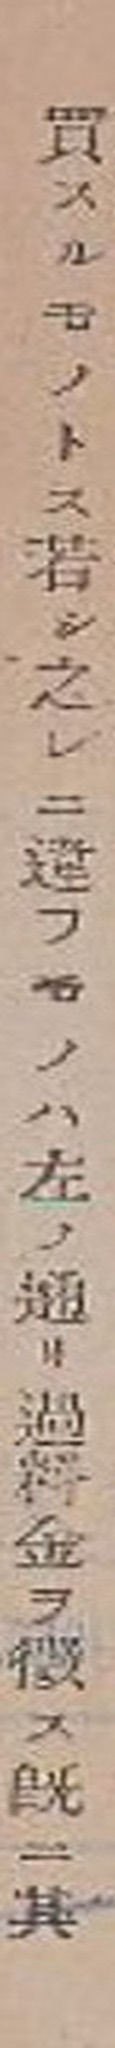買スルモノトス若シ之レニ違フモノハ左ノ通リ過料金ヲ徴ス既ニ其
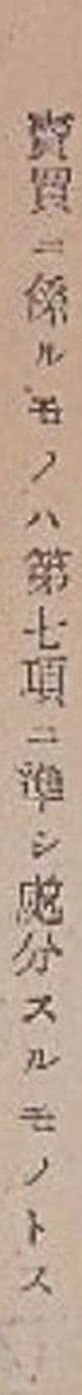賣買ニ係ルモノハ第七項ニ準シ處分スルモノトス
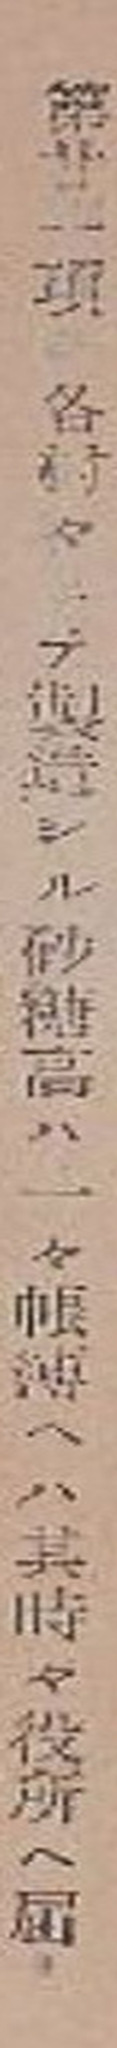第廿一項各村々ニテ製造シル砂糖高ハ一々帳簿ヘハ其時々役所ヘ届

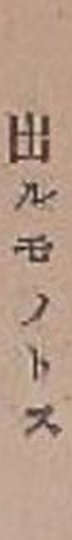出ルモノトス
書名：製糖取締旧慣内法
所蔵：University of the Ryukyus Library
